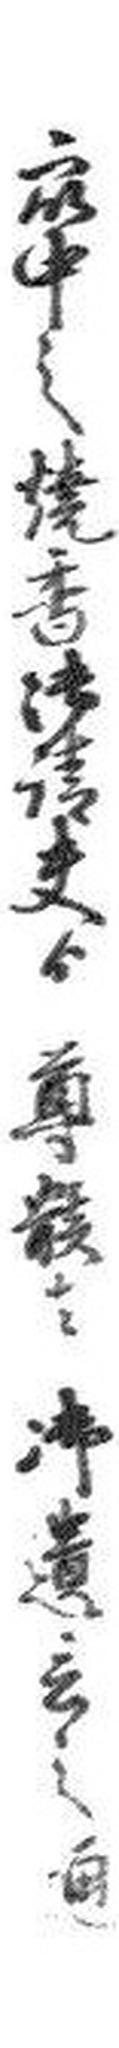衆中之焼香御請夫ゟ尊骸者御遺言之通
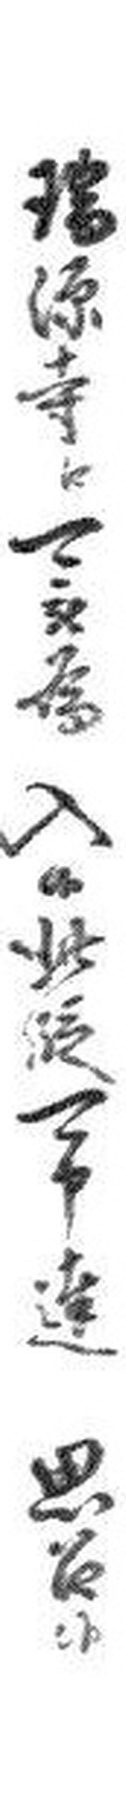瑞源寺江可被為入候此段可申達思召候
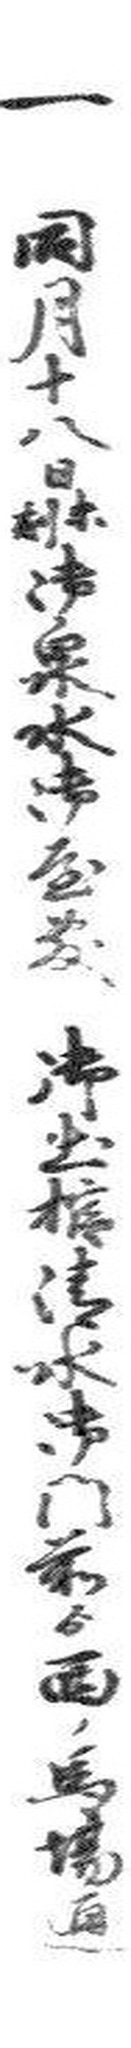一同月十八日未刻御泉水御屋敷御出棺清水御門前ゟ西ノ馬場通
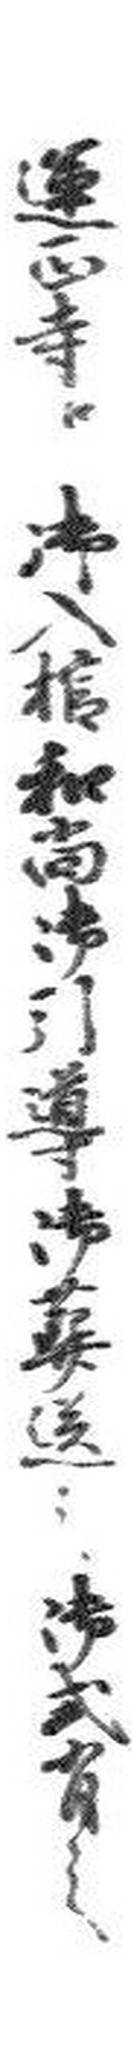運正寺江御入棺和尚御引導御葬送之御式有之
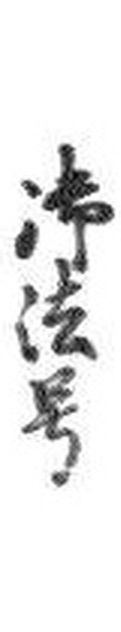御法号
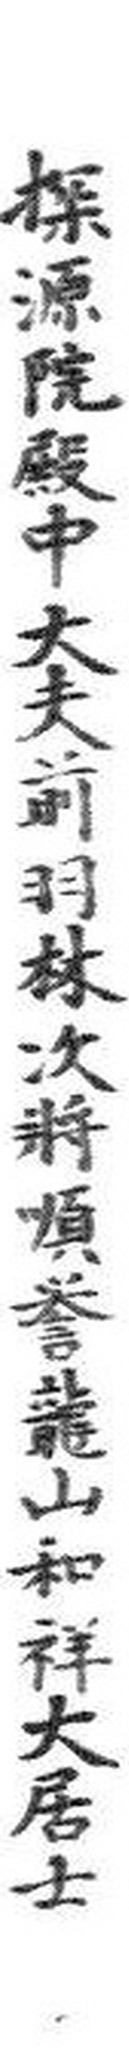探源院殿中大夫前羽林次将順誉龍山和祥大居士
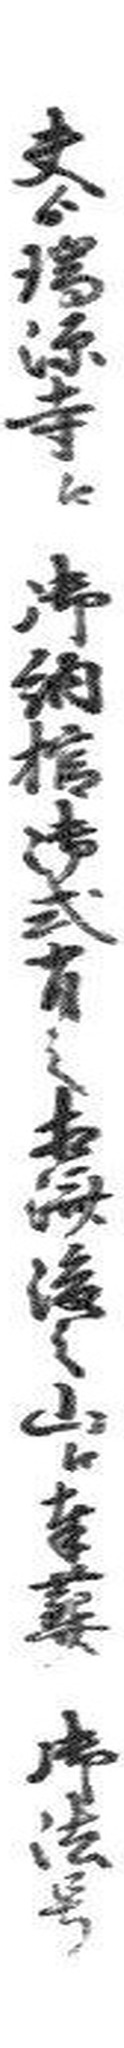夫ゟ瑞源寺江御納棺御式有之相済後之山江奉葬御法号
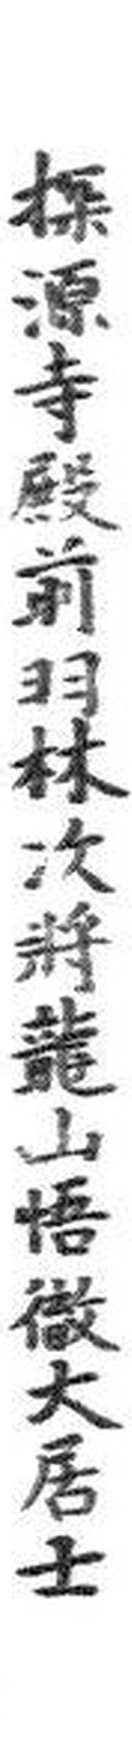探源院殿前羽林次将順誉龍山悟徹大居士

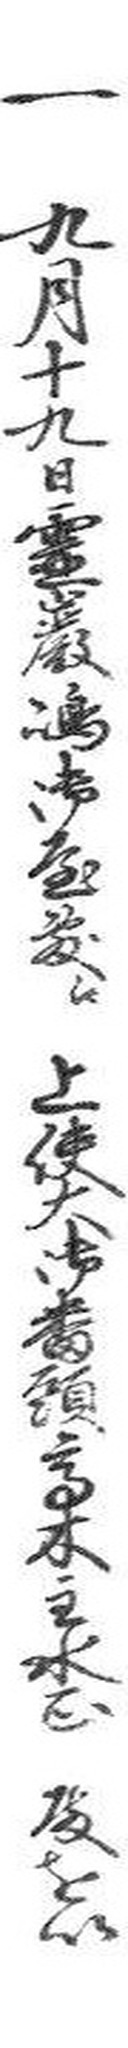一九月十九日霊巌嶋御屋敷江上使大御番頭高木主水正殿を以
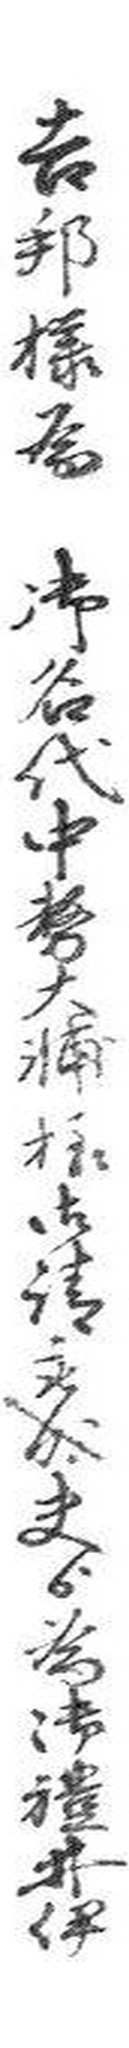吉邦様為御名代中務大輔様御請被成夫ゟ為御礼井伊
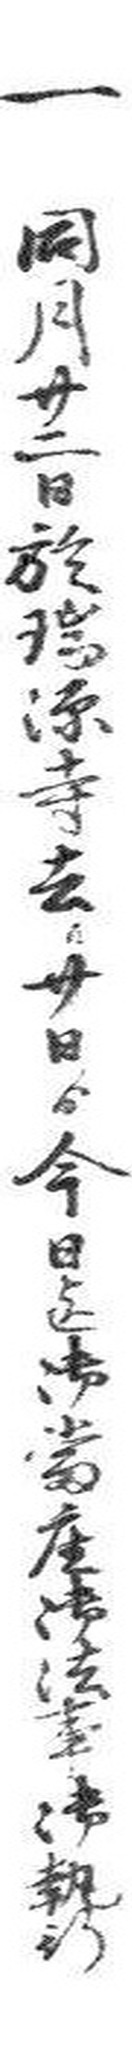一同月廿二日於瑞源寺去ル廿日ゟ今日迄御当座御法事御執行
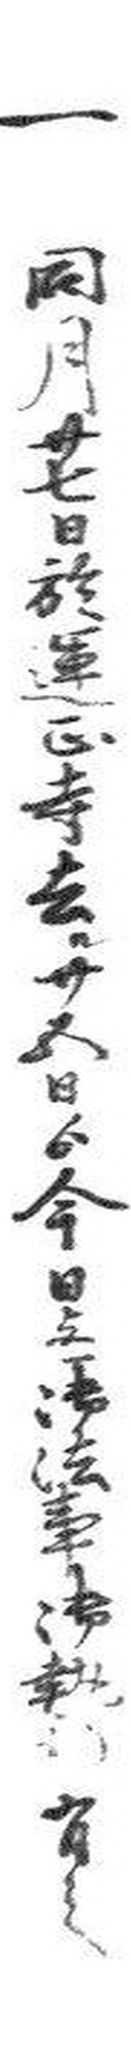一同月廿七日於運正寺去ル廿五日ゟ今日迄御法事御執行有之
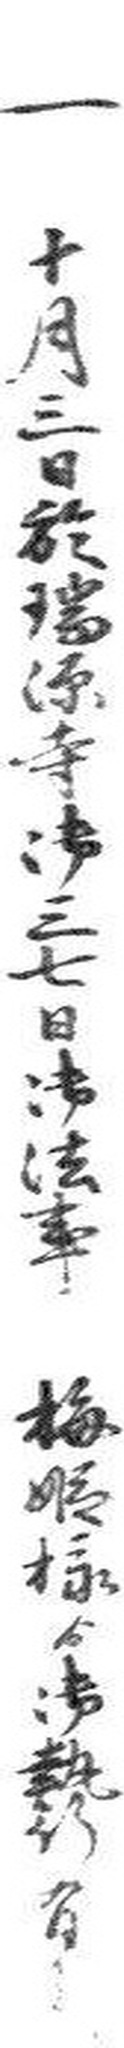一十月三日於瑞源寺御三七御法事梅姫様ゟ御執行有之
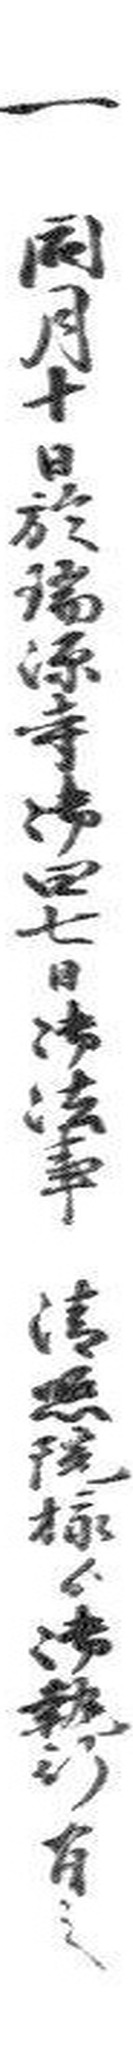一同月十日於瑞源寺御四七日御法事清照院様ゟ御執行有之
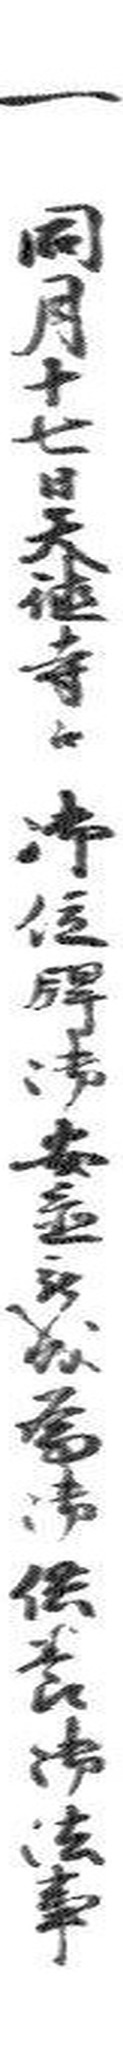一同月十七日天徳寺江御位牌御安置被成為御供養御法事
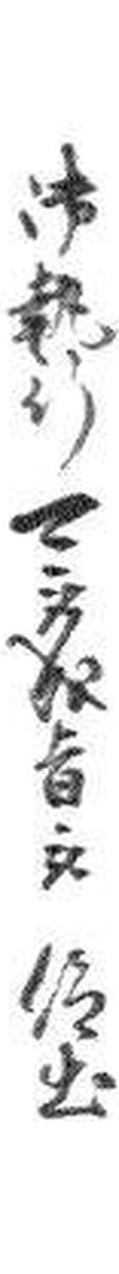御執行可被成旨被仰出
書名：家譜 二十六 吉品公 従宝永七年到正徳二年
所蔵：福井県文書館 Fukui Prefectural Archives
